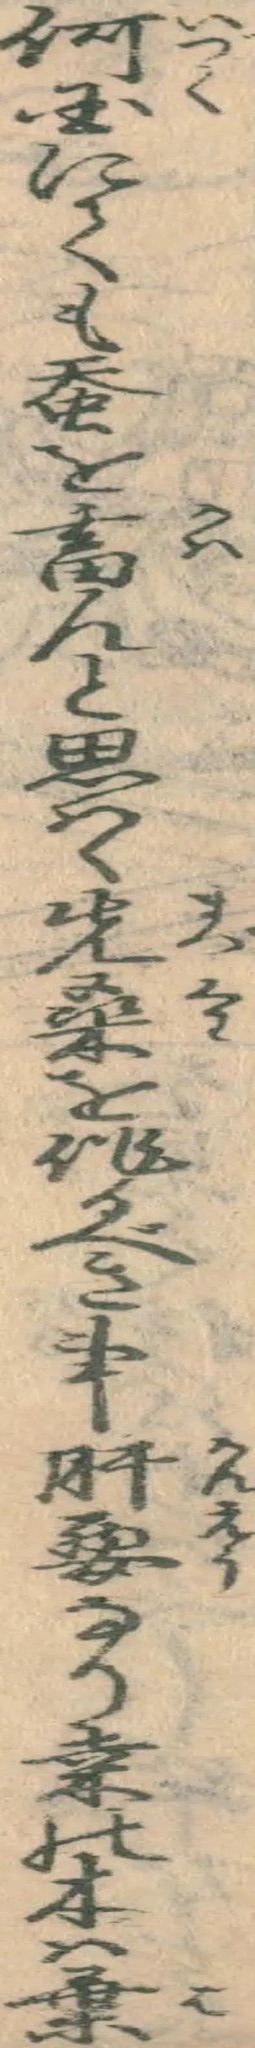何国にても蚕を畜んと思はゝ先桑を作るべき事肝要なり桑の木は葉
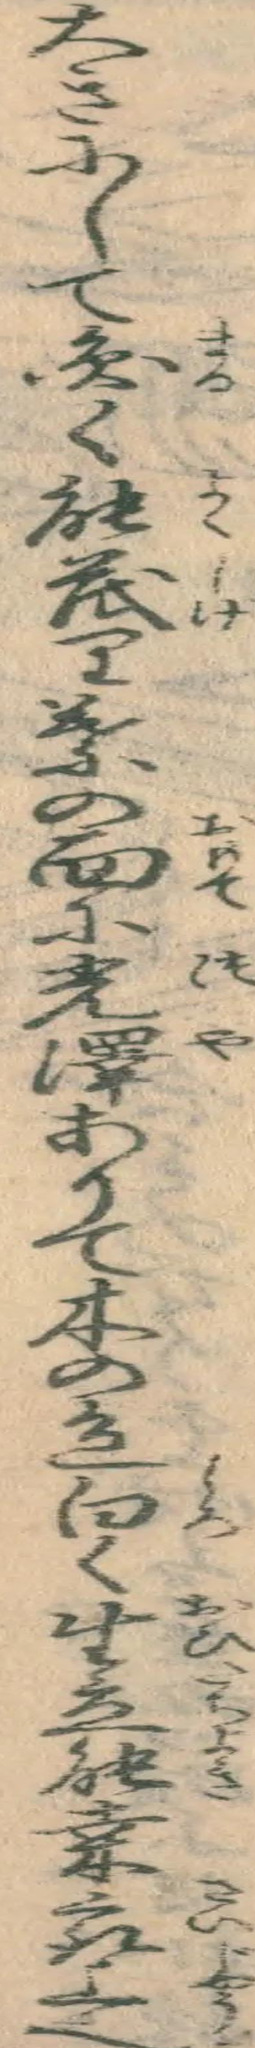大きにして円く能茂り葉の面に光沢ありて木の色白く生立能桑最上也
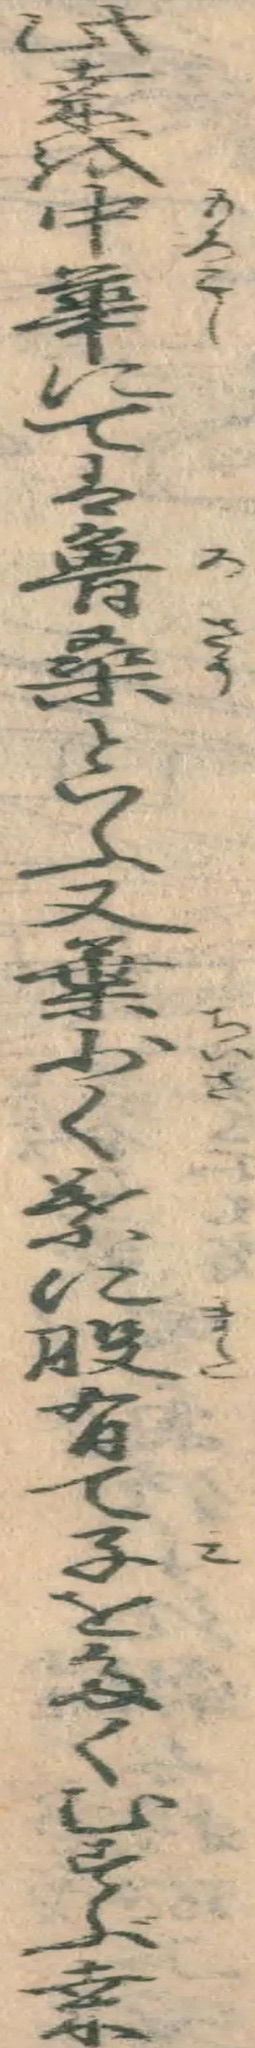此桑を中華にては魯桑といふ又葉少く葉に股有て子を多くむすぶ桑
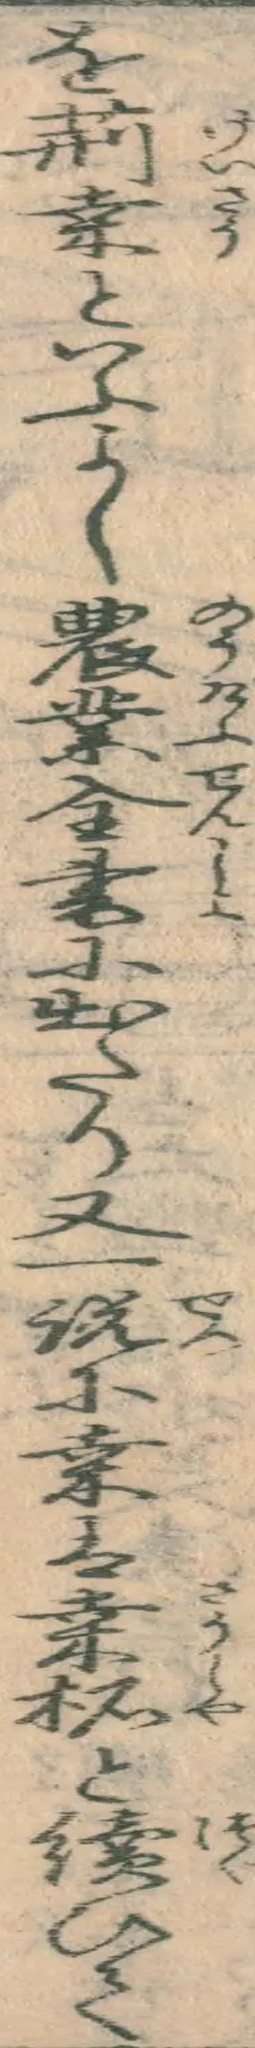を荊桑といふよし農業全書に出たり又一説に桑は桑柘と続ひて
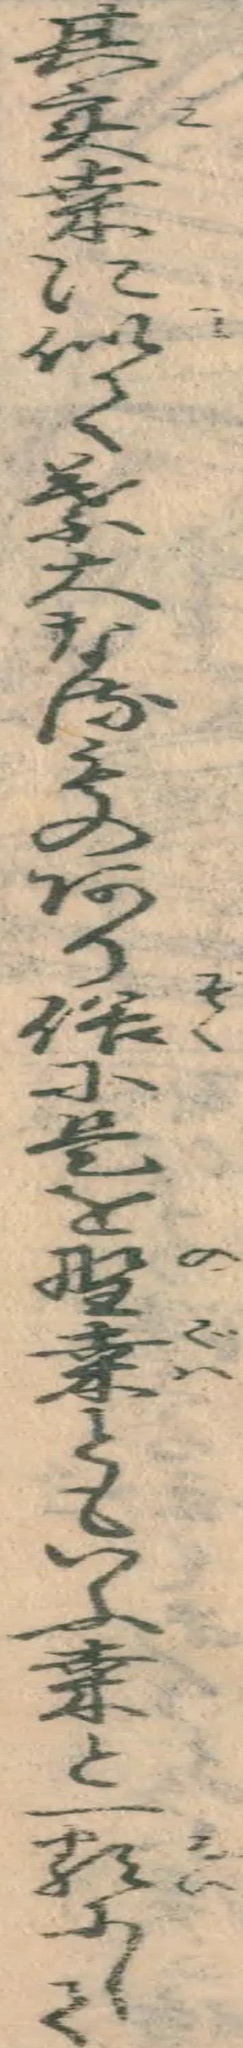其実桑に似て葉大なるものあり俗に是を野桑ともいふ桑と一類にして
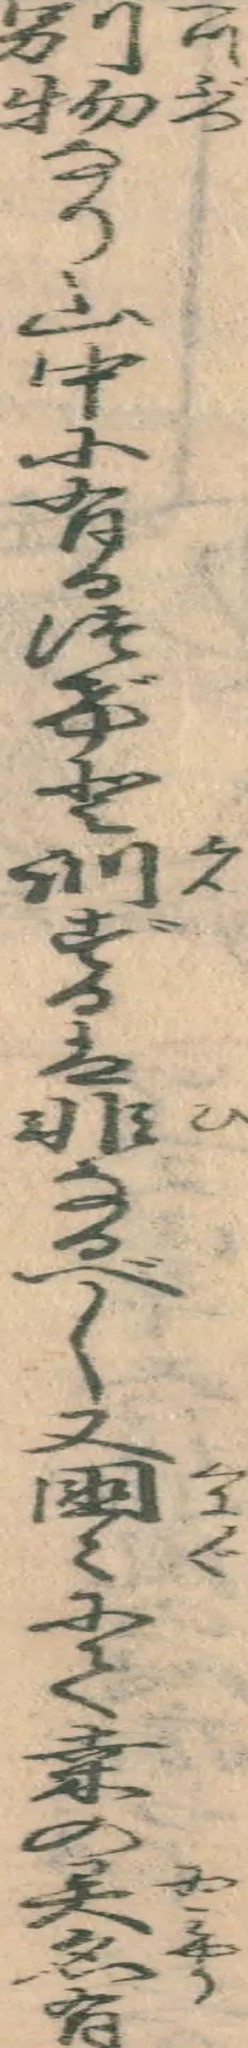別物なり山中に有るつげと訓ずるは非なるべし又国々にて桑の異名有
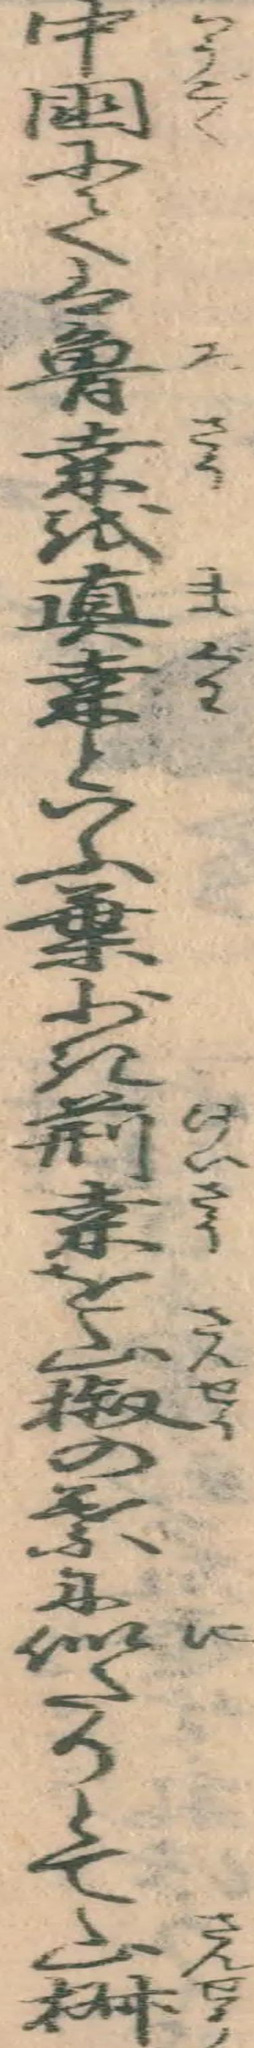中国にては魯桑を真桑といふ葉少き荊桑を山椒の葉に似たりとて山枡
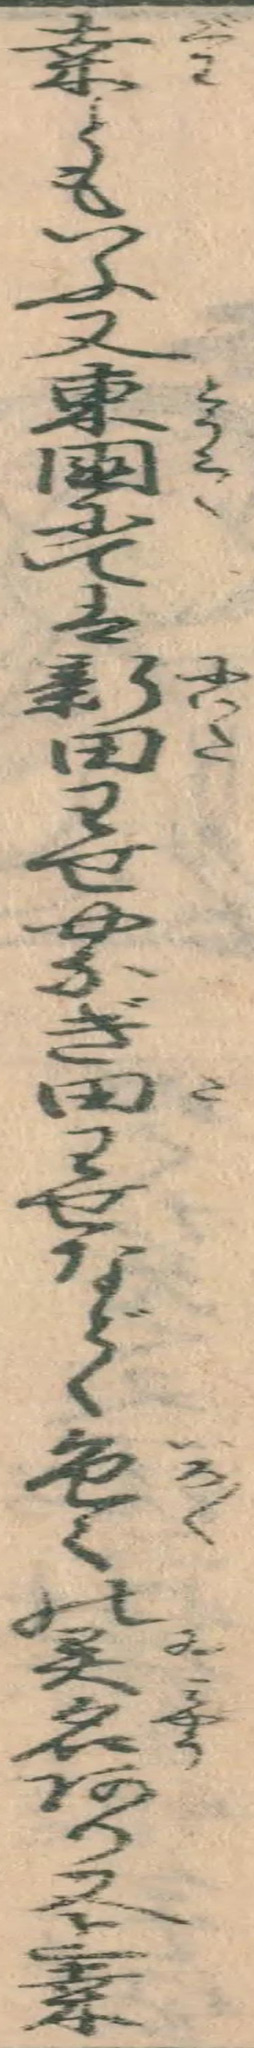桑ともいふ又東国にては新田わせやなぎ田わせなどゝ色々の異名あり又上桑
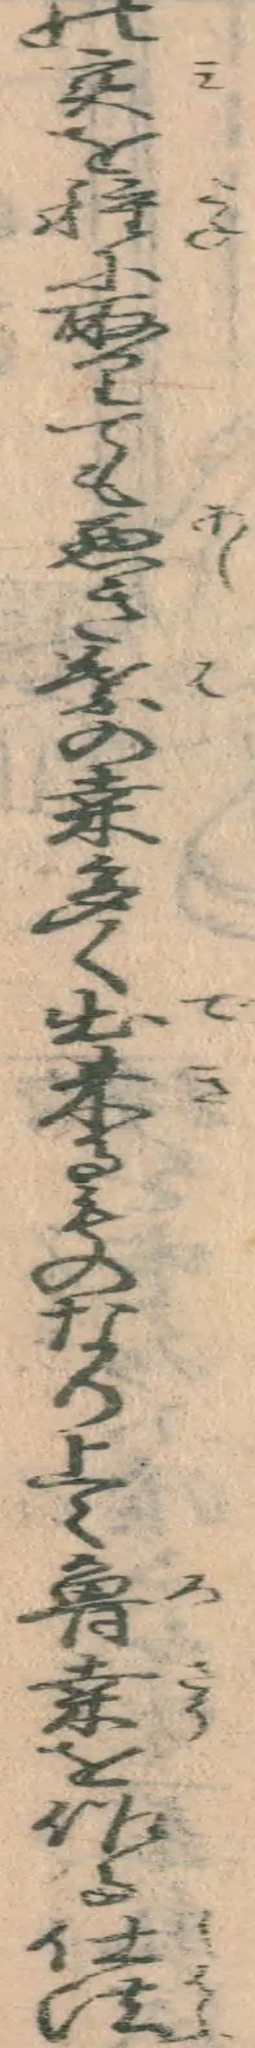の実を種に取りても悪き葉の桑多く出来るものなり上々魯桑を作る仕法
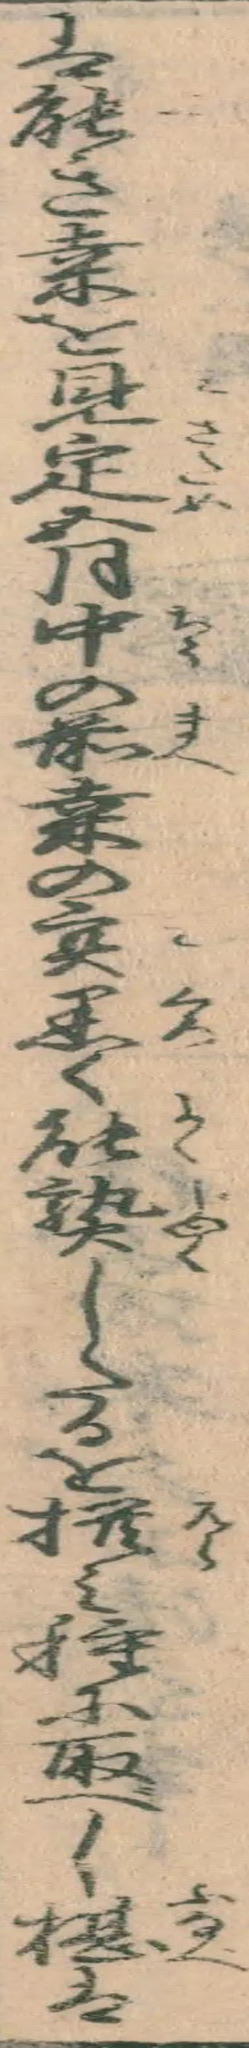は能き桑を見定五月中の前桑の実黒く能熟したるを撰み種に取べし椹は
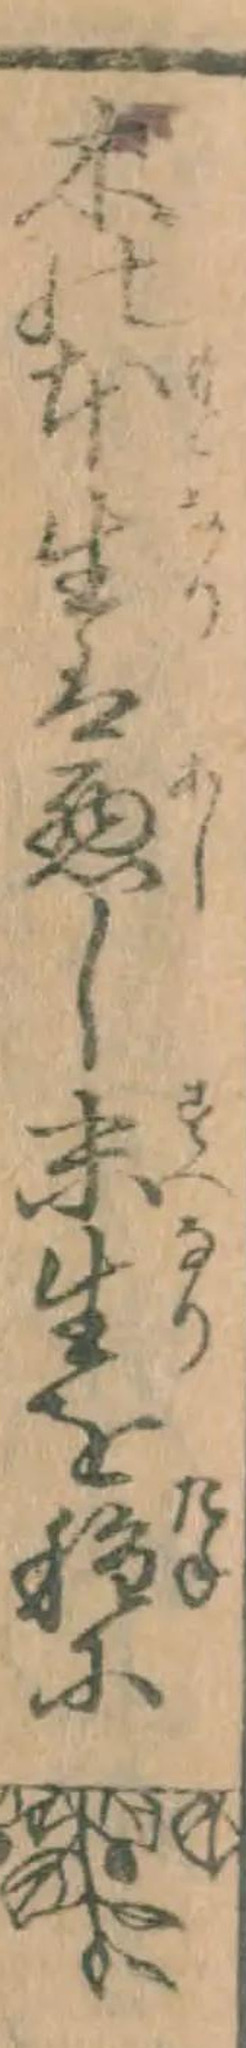木の本生は悪し末生を種に
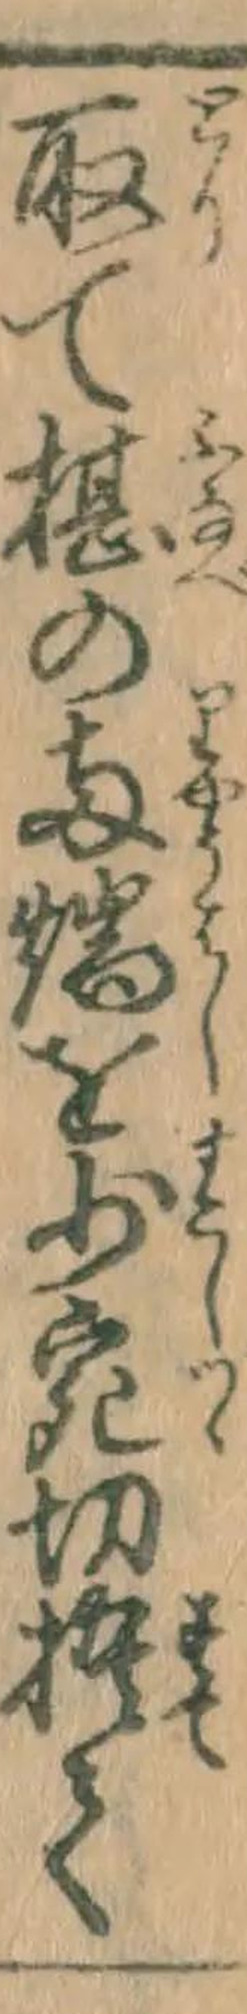取て椹の両端を少宛切捨て
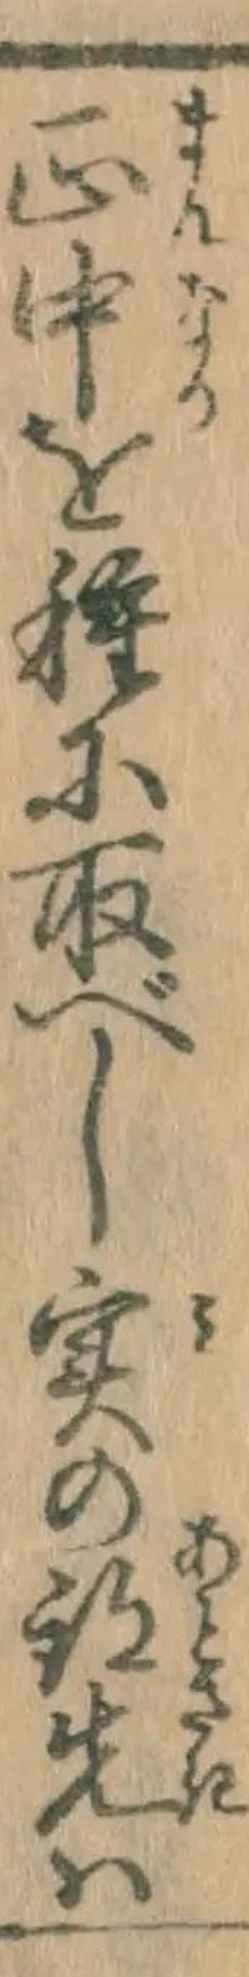正中を種に取べし実の跡先は
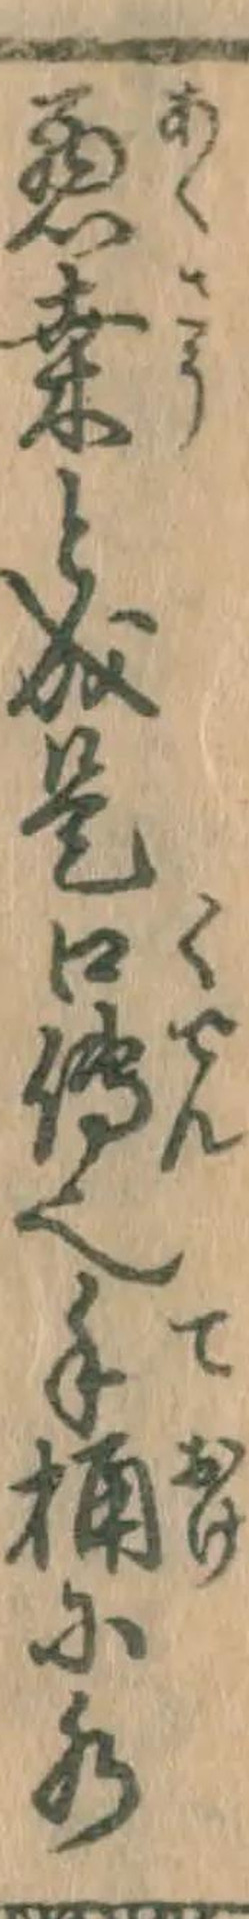悪桑と成是口伝也手桶に水
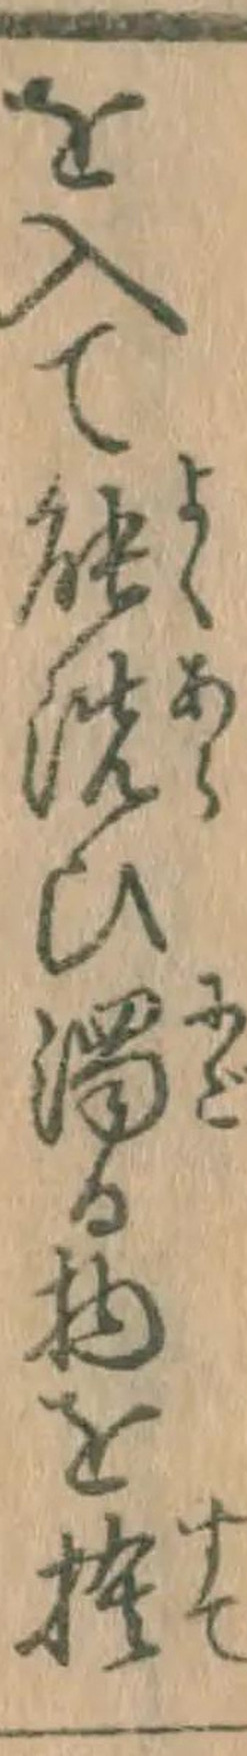を入て能洗ひ濁る物を捨
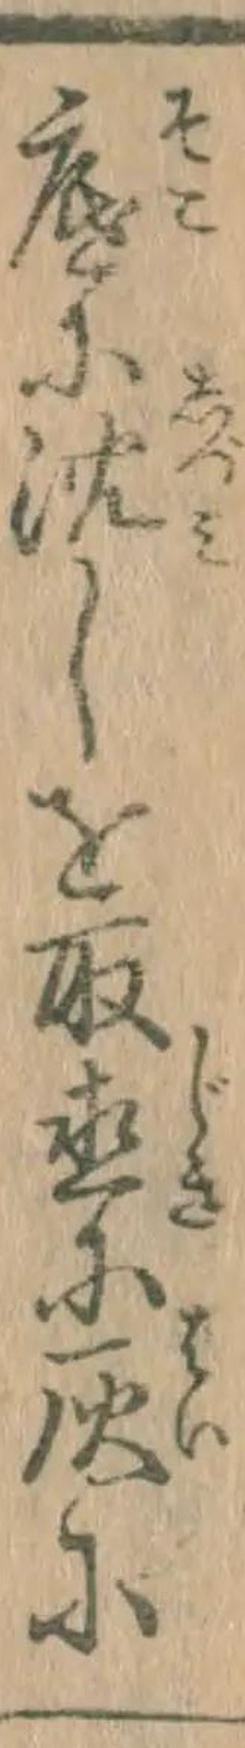底に沈しを取直に灰に
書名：養蚕秘録 3巻. [1]
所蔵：国立国会図書館 National Diet Library, JAPAN
